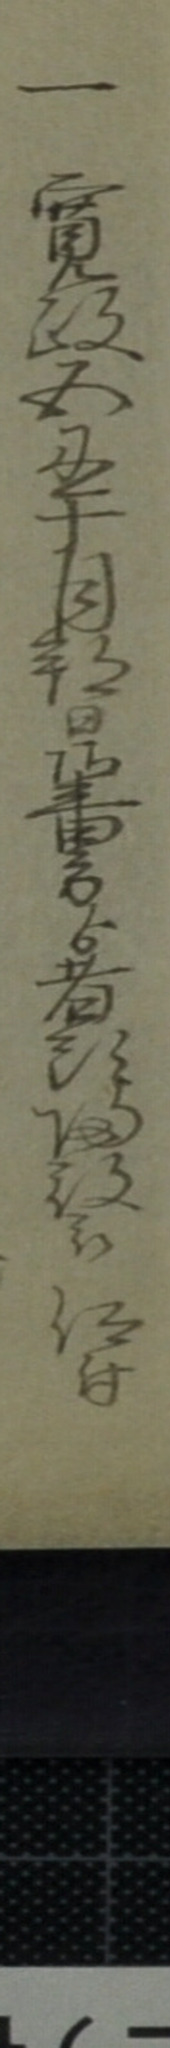一寛政五丑十月朔日御番方ゟ者頭帰役被仰付
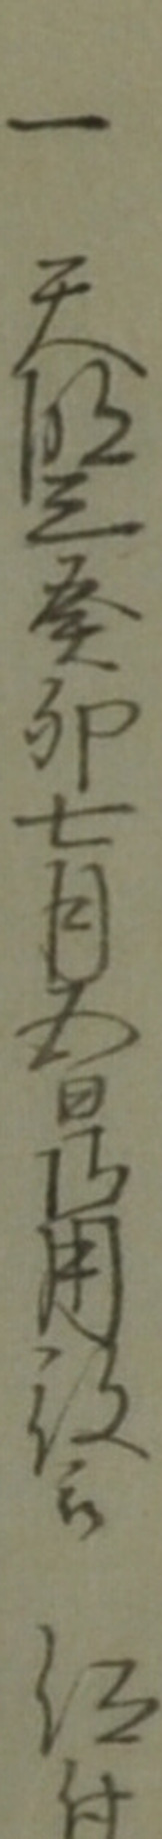一天明三癸卯七月五日御用役被仰付
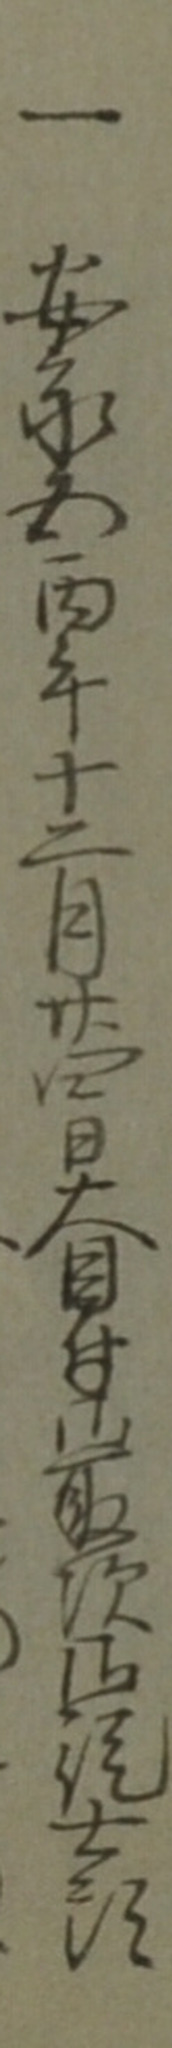一安永五丙午十二月廿四日大目付御取次御徒士頭
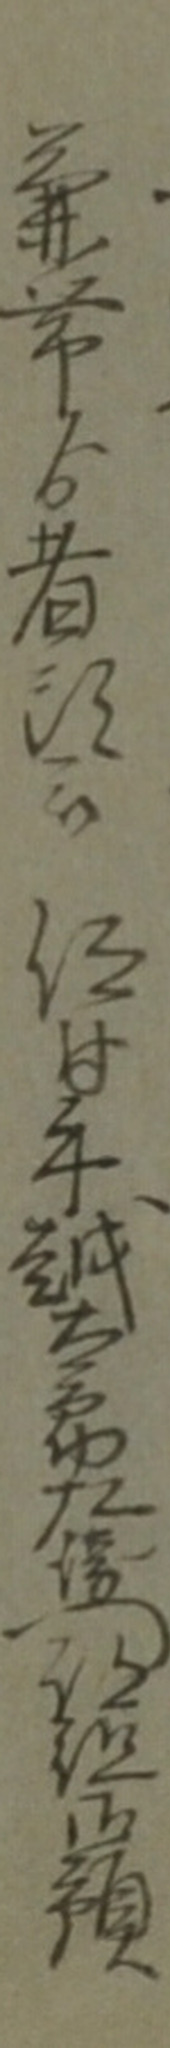兼帯ゟ者頭被仰付牛越太郎左衛門跡組御預
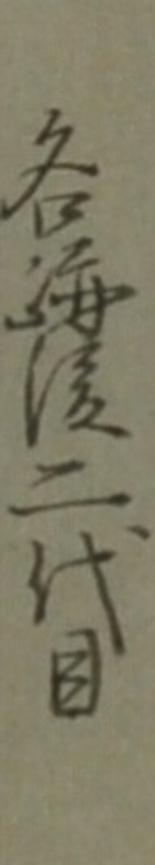名跡後二代目
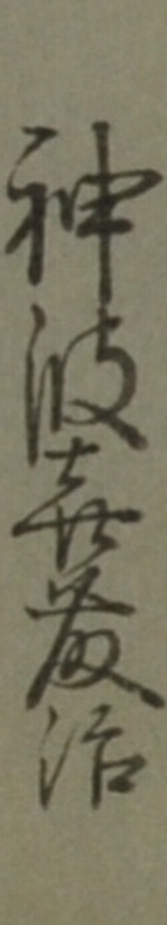神波喜藤治
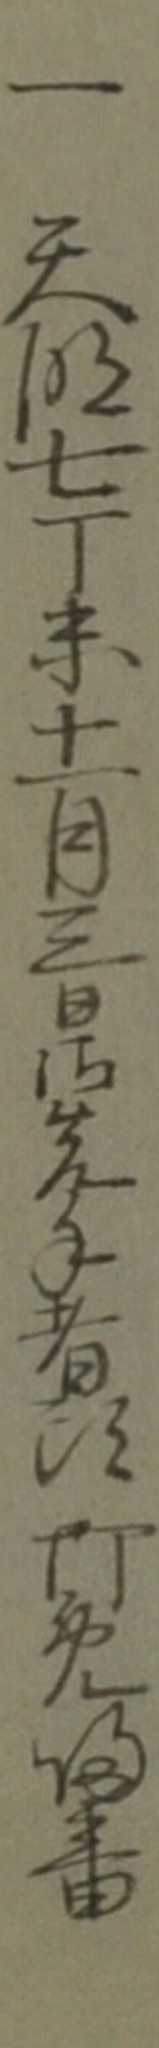一天明七丁未十一月三日御先手者頭御免帰番
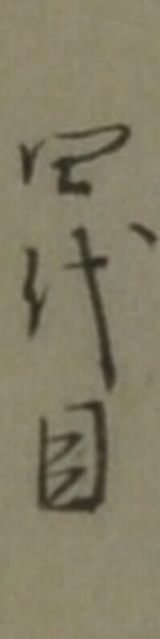四代目
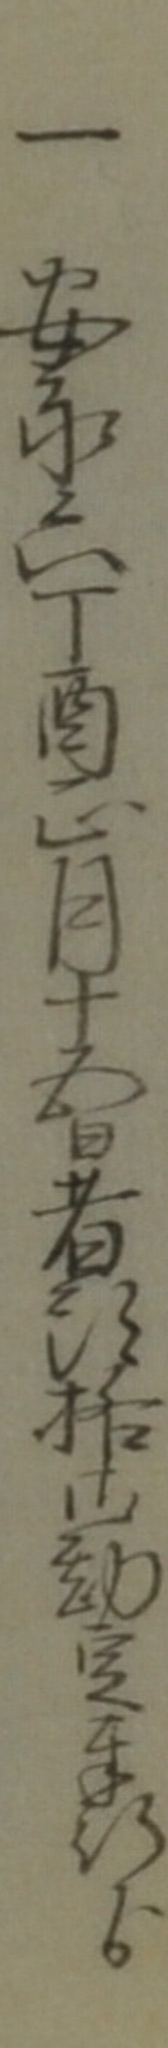一安永六丁酉正月十五日者頭格御勘定奉行ゟ
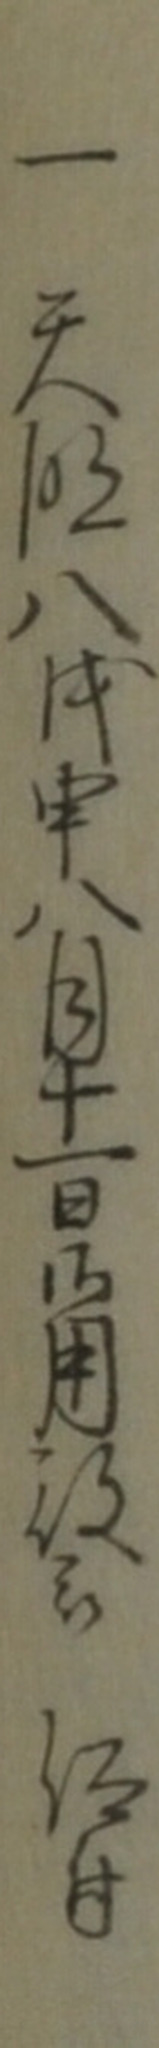一天明八戊申八月十一日御用役被仰付
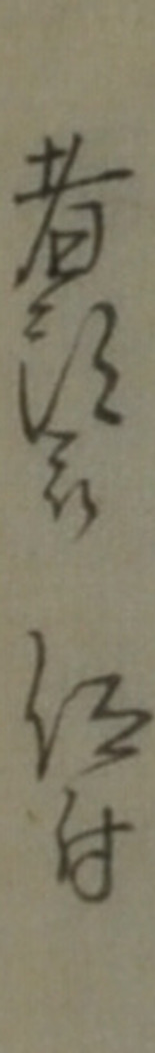者頭被仰付
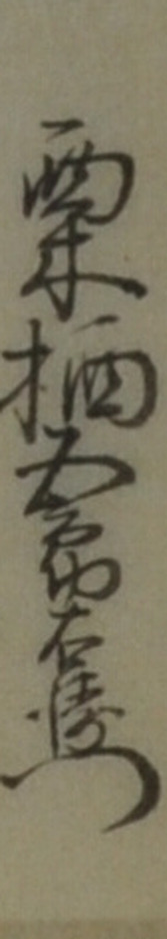栗栖五郎右衛門
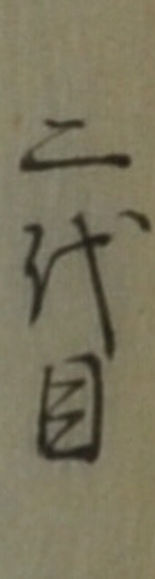二代目
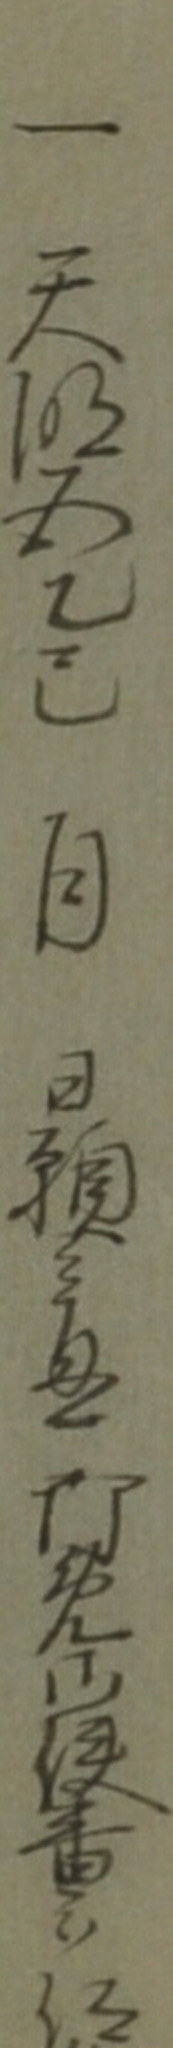一天明五乙巳月日願之通御免御使番被仰付
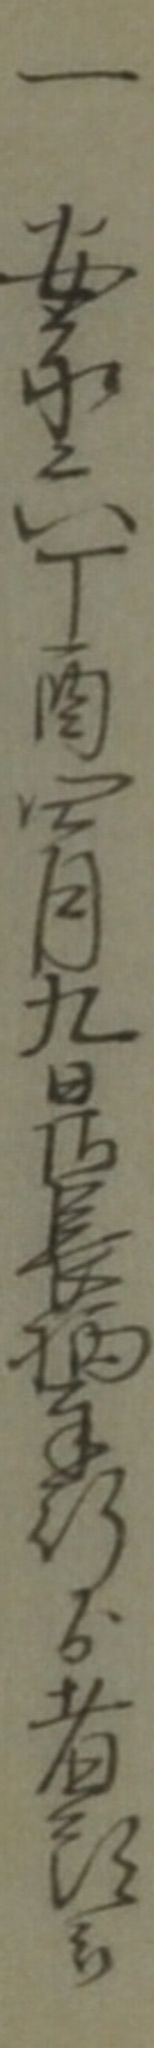一安永六丁酉四月九日御長柄奉行ゟ者頭被
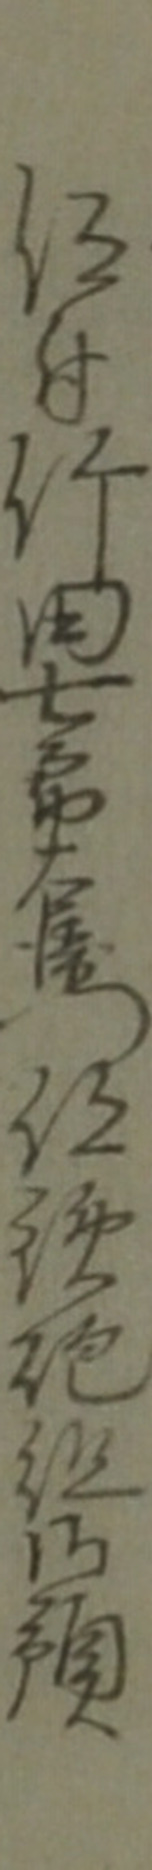仰付竹田七郎右衛門跡鉄砲組御預
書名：諸御役代々録（二）
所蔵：伊那市立高遠町図書館・合同会社AMANE
